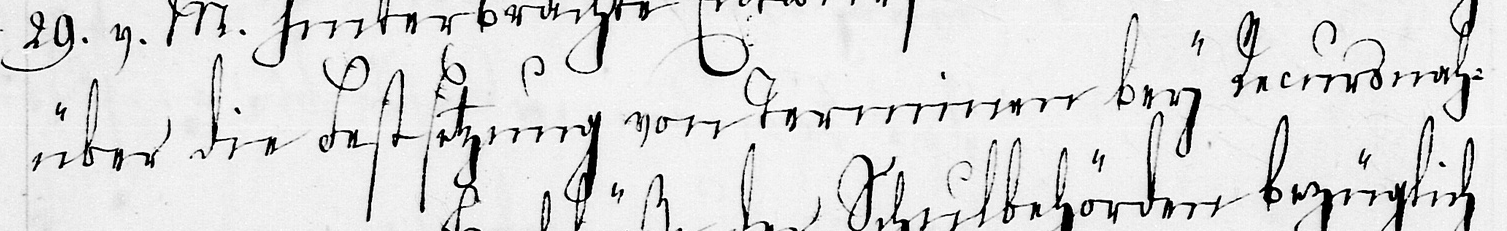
über die Festsetzung von Terminen bey Recursnah¬
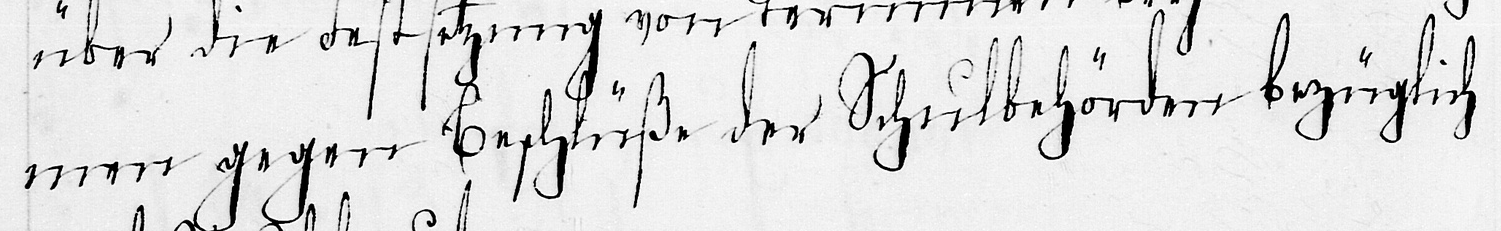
men gegen Beschlüße der Schulbehörden bezüglich
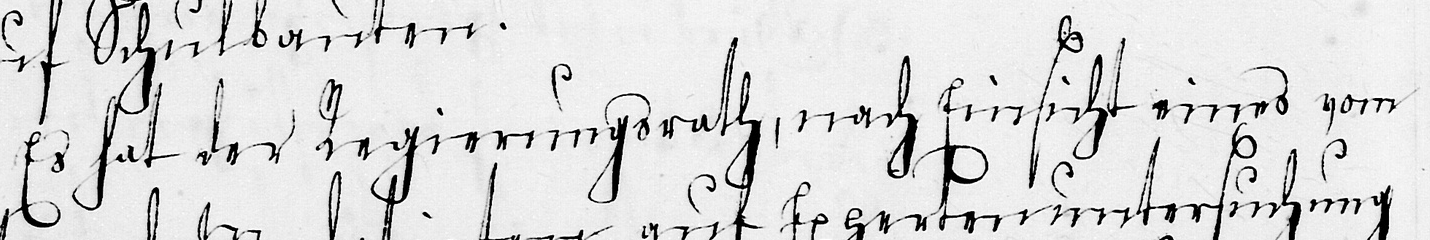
Es hat der Regierungsrath, nach Einsicht eines vom
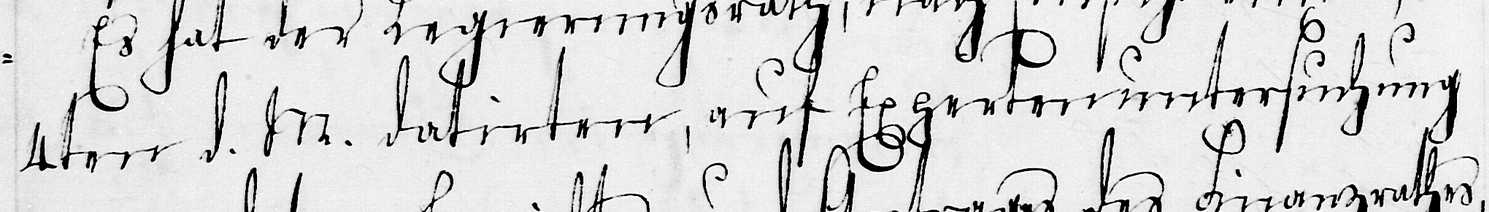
4ten d. M. datirten, auf Expertenuntersuchung
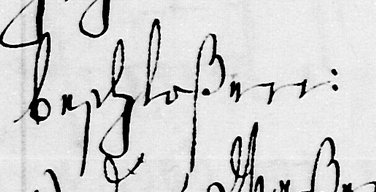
eschloßen:
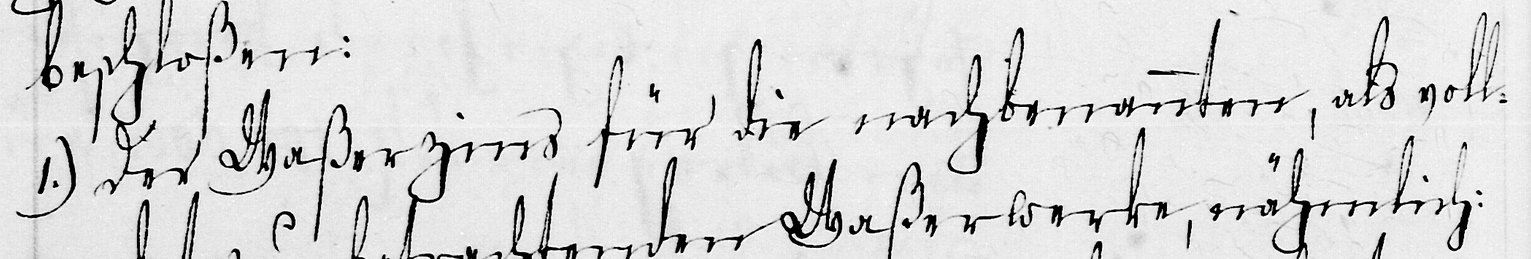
1.) Der Waßerzins für die nachbenannten, als voll¬
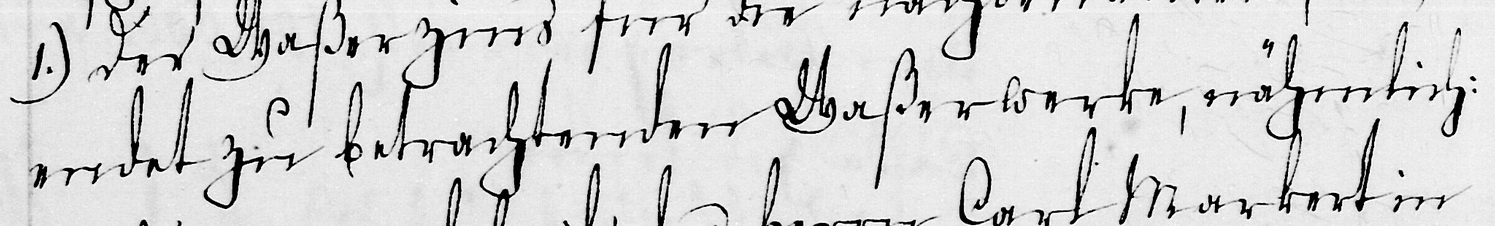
endet zu betrachtenden Waßerwerke, nähmlich:
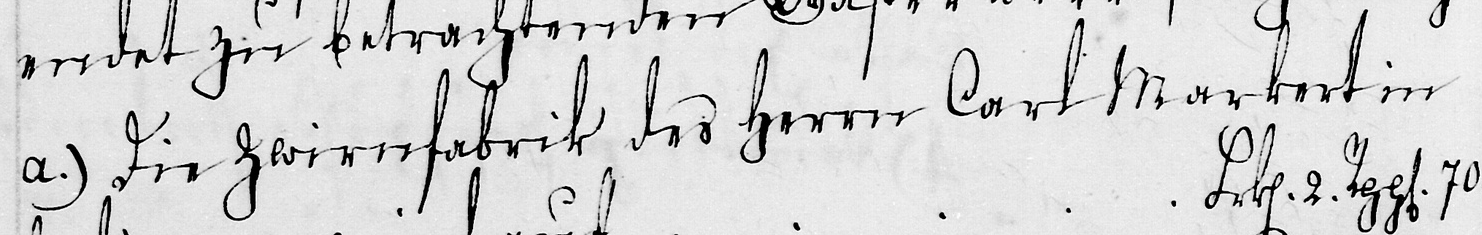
a.) Die Zwirnfabrik des Herrn Carl Markert in
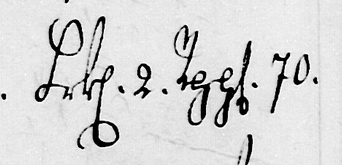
Hedingen in
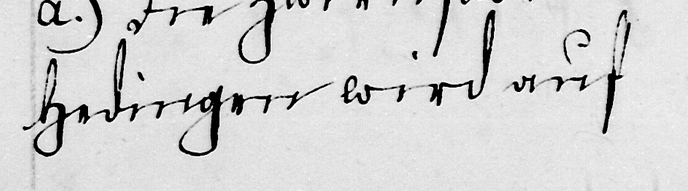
Hedingen wird auf
